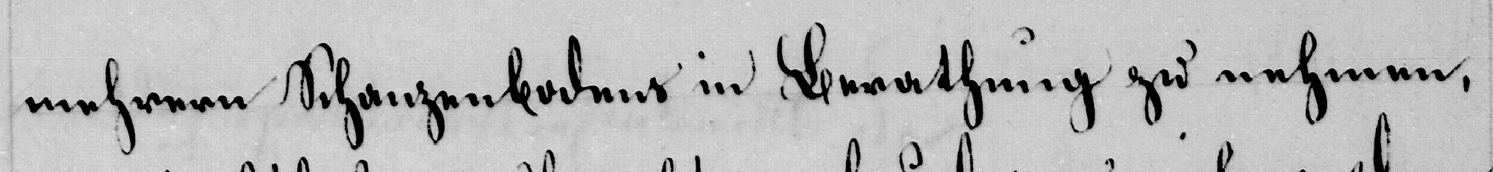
mehrern Schanzenbodens in Berathung zu nehmen,
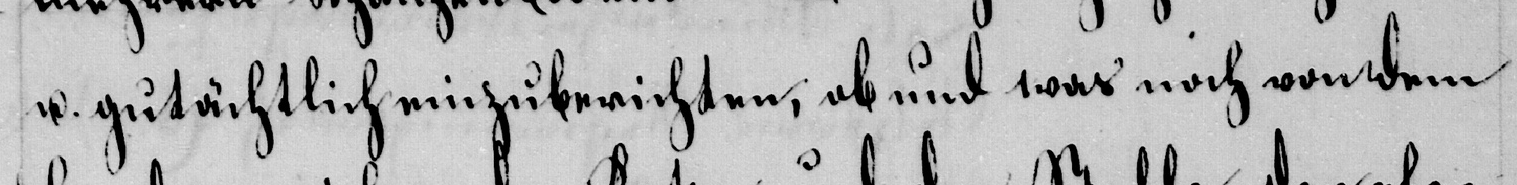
u. gutächtlich einzuberichten, ob und was noch von dem
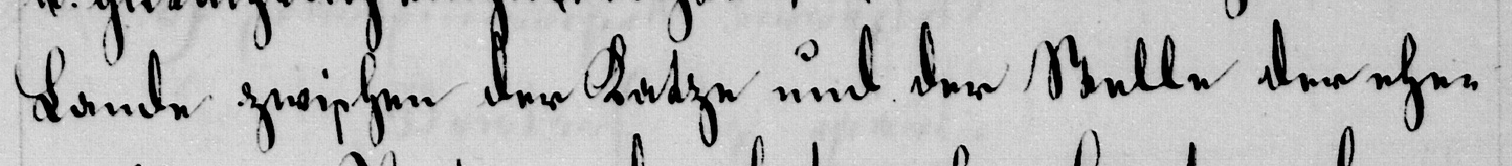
Lande zwischen der Katze und der Stelle der ehe¬
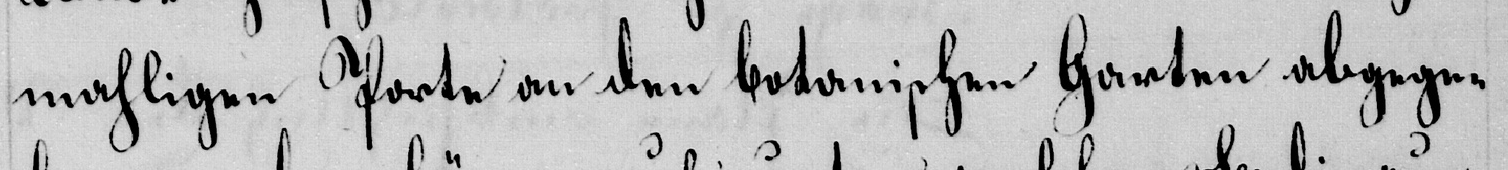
mahligen Porte an den botanischen Garten abgege¬
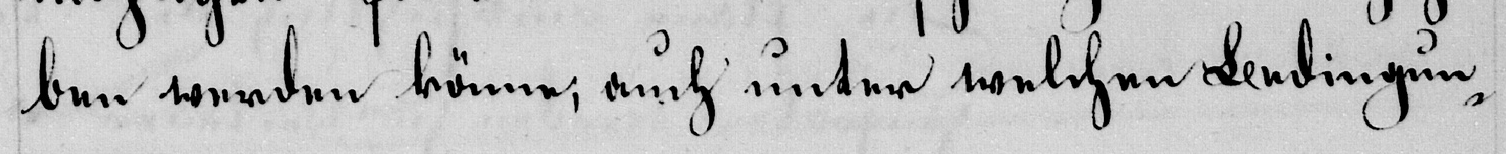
ben werden könne; auch unter welchen Bedingun¬
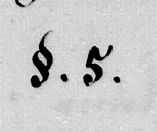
§. 5.
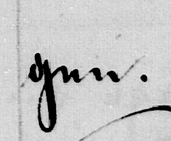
gen.
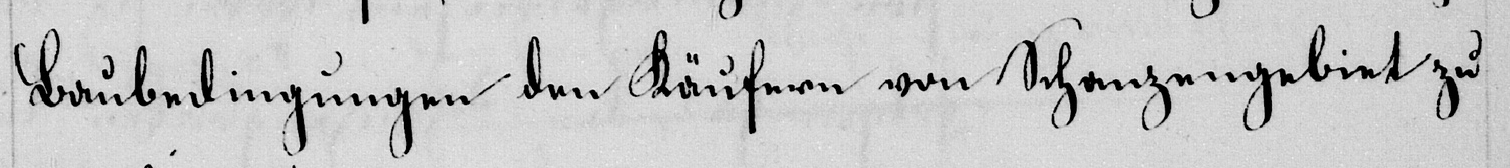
Baubedingungen den Käufern von Schanzengebiet zu
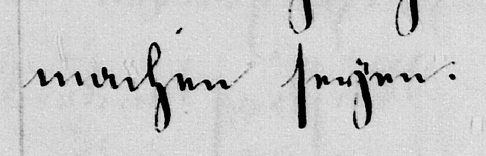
machen seyen.
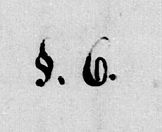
§. 6.
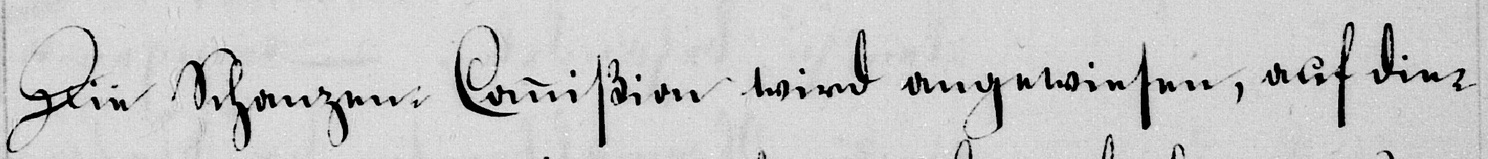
Die Schanzen-Commißion wird angewiesen, auf die¬
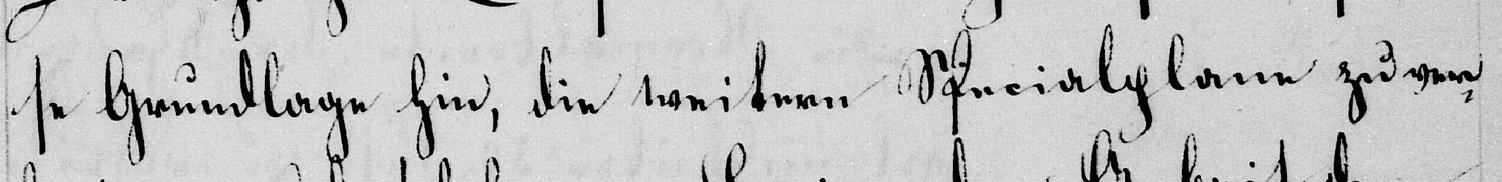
se Grundlage hin, die weitern Specialplane zu ver¬
